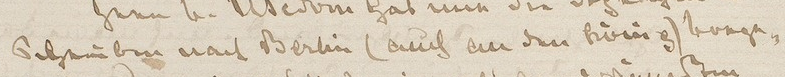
Schreiben nach Berlin (auch an den König) vorge-
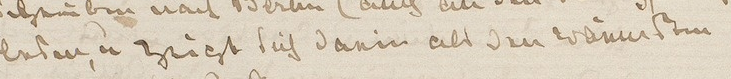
lesen, u zeigt sich darin als den wärmsten
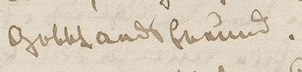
Gotthardsfreund.
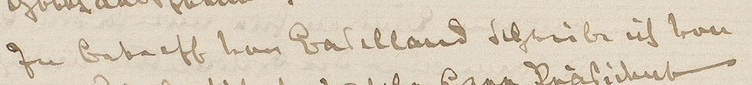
In Betreff von Baselland schreibe ich von
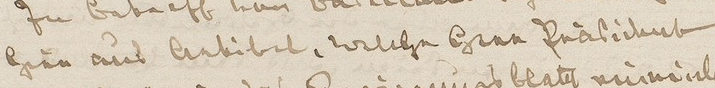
hier aus Artikel, welche Herr Präsident
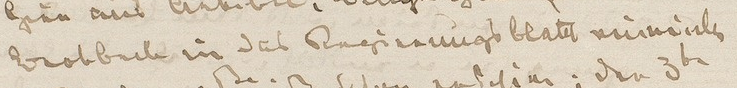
Brotbeck in das Regierungsblatt einrücken
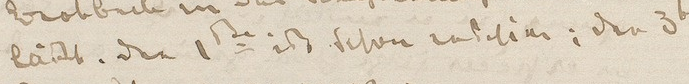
läßt. Der 1te ist schon erschienen; der 3te
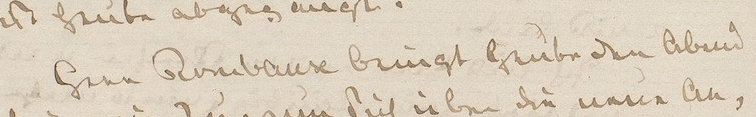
Herr Rombaux bringt heute den Abend
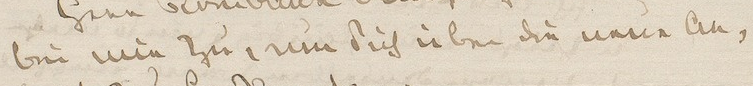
bei mir zu, um sich über die neue Ar-
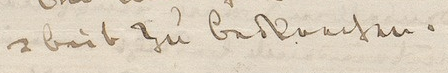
beit zu besprechen.
